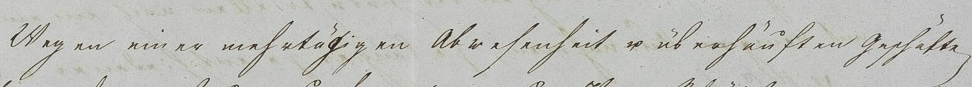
Wegen einer mehrtägigen Abwesenheit & überhäuften Geschäften
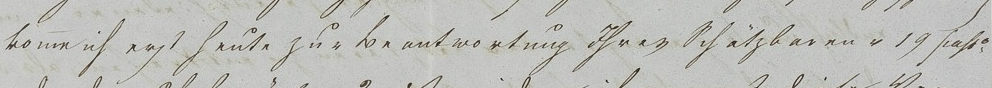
komme ich erst heute zur Beantwortung Ihres Schätzbaren v 19 passe
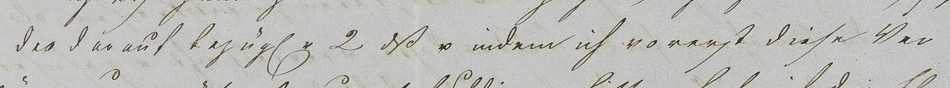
des darauf bezügl v 2 dß & indem ich vorerst diese Ver-
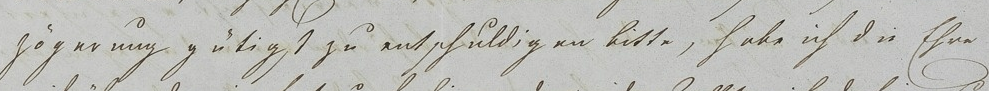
zögerung gütigst zu entschuldigen bitte, habe ich die Ehre
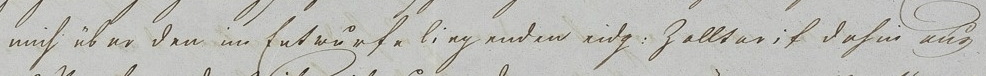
mich über den im Entwurfe liegenden eidg: Zolltarif dahin aus-
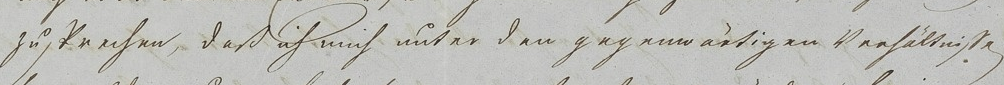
zusprechen, daß ich mich unter den gegenwärtigen Verhältnissen
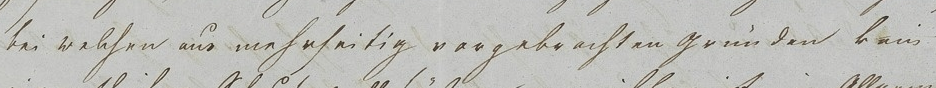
bei welchen aus mehrseitig vorgebrachten Gründen kein
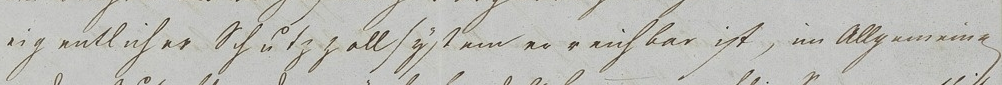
eigentliches Schutzzollsystem erreichbar ist, im Allgemeinen
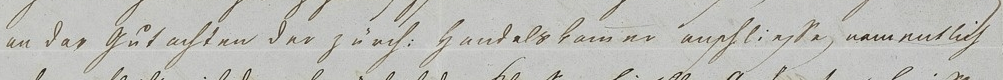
an das Gutachten der zürch: Handelskammer anschliesse, namentlich
